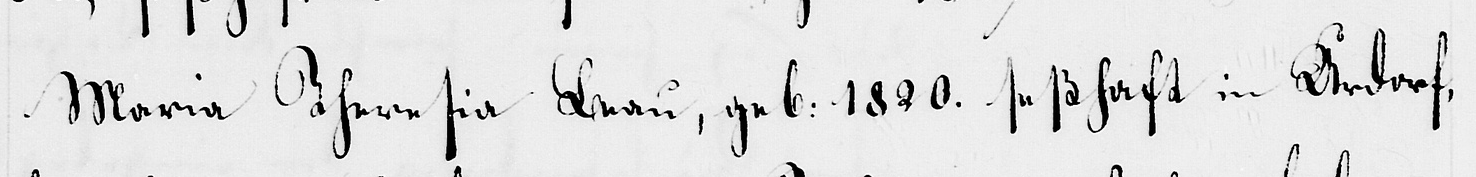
Maria Theresia Beau, geb: 1820. seßhaft in Urdorf,
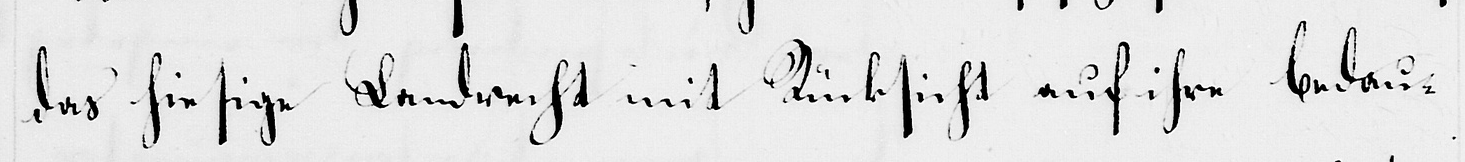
das hiesige Landrecht mit Rücksicht auf ihre bedau¬
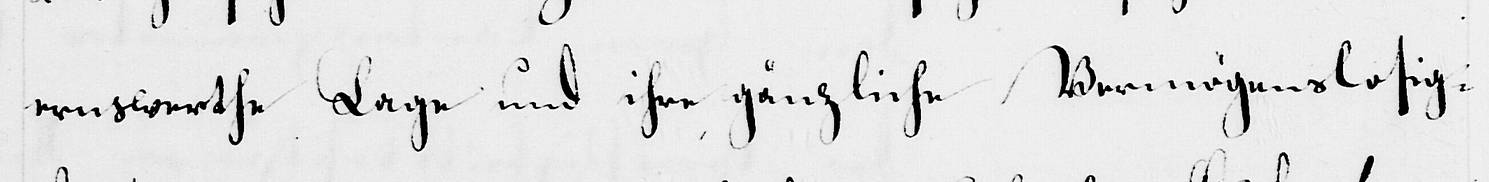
ernswerthe Lage und ihre gänzliche Vermögenslosig¬
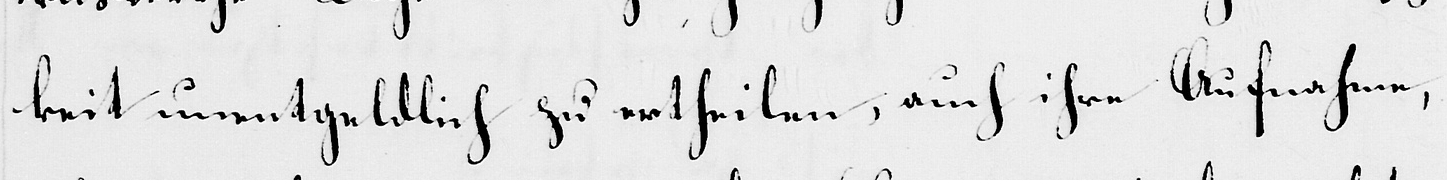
keit unentgeldlich zu ertheilen, auch ihre Aufnahme,
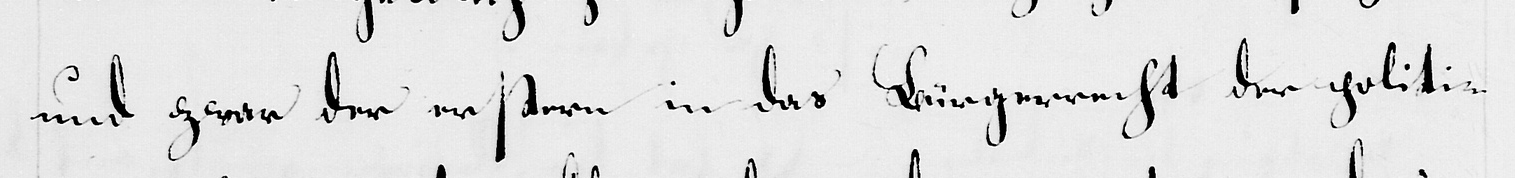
und zwar der erstern in das Bürgerrecht der politi¬
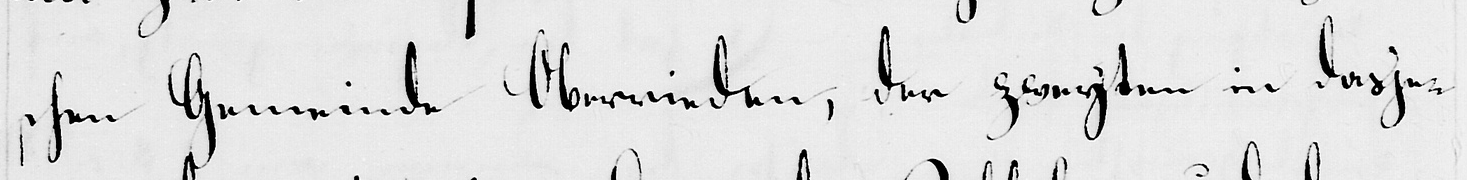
schen Gemeinde Oberrieden, der zweyten in dasje¬
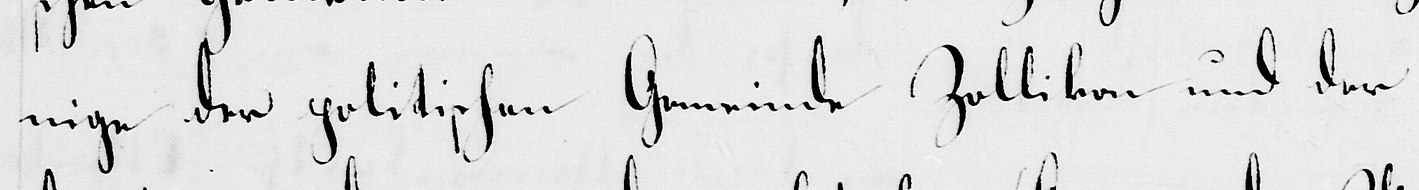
nige der politischen Gemeinde Zollikon und der
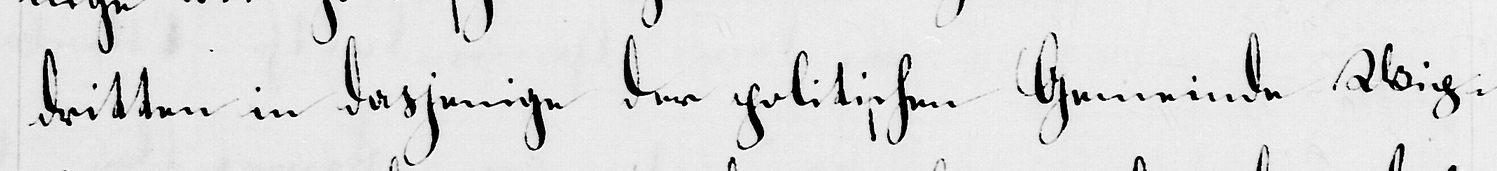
dritten in dasjenige der politischen Gemeinde Wip¬
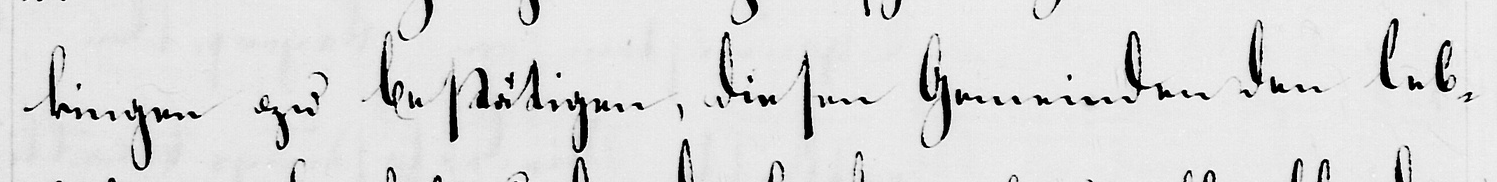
kingen zu bestätigen, diesen Gemeinden den leb¬
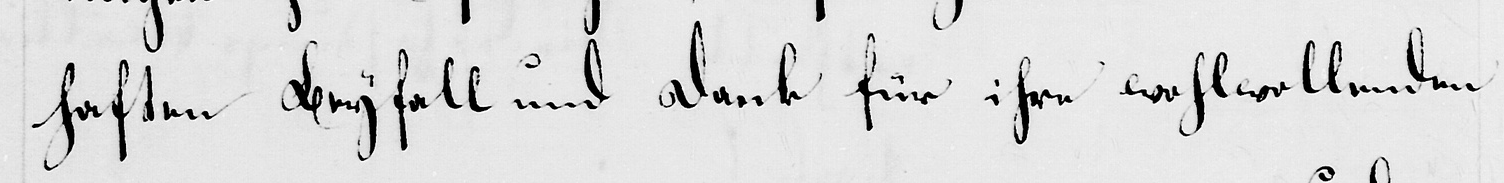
haften Beyfall und Dank für ihre wohlwollenden
